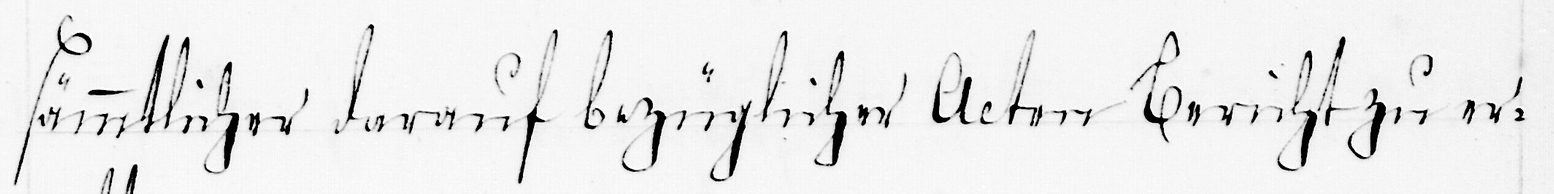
sämmtlicher darauf bezüglicher Acten Bericht zu er¬
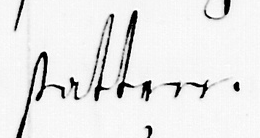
statten.
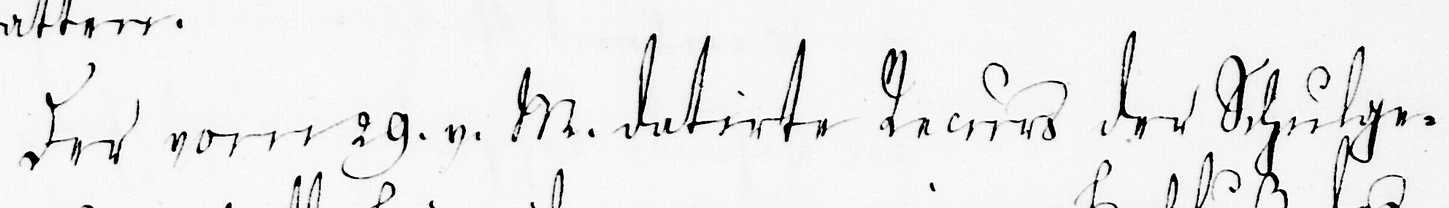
Der vom 29. v. M. datirte Recurs der Schulge¬
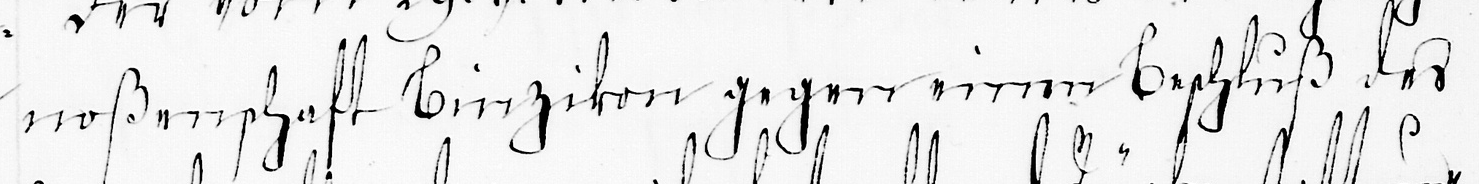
noßenschaft Binzikon gegen einen Beschluß des
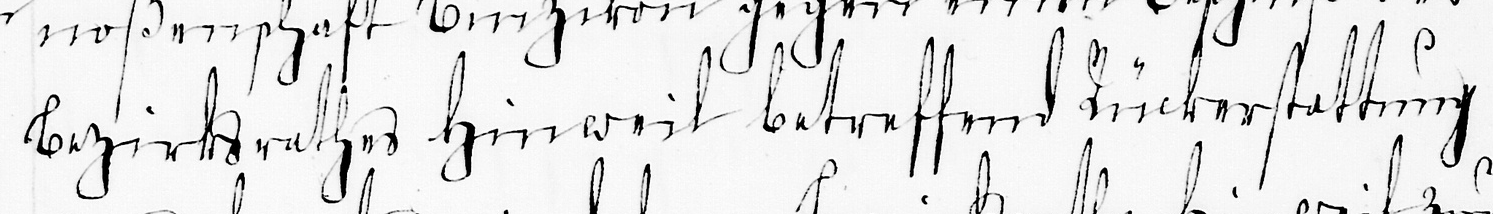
Bezirksrathes Hinweil betreffend Rückerstattung
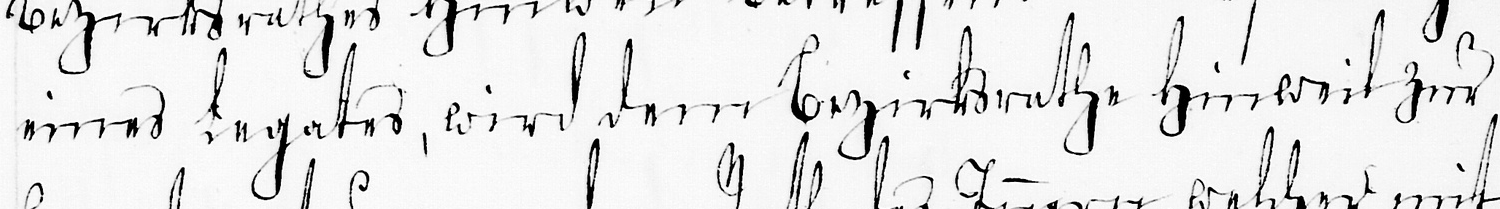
eines Legates, wird dem Bezirksrathe Hinweil zur
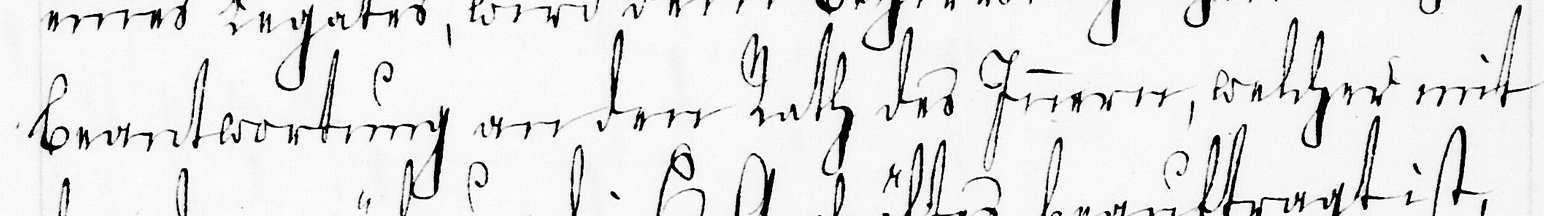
Beantwortung an den Rath des Innern, welcher mit
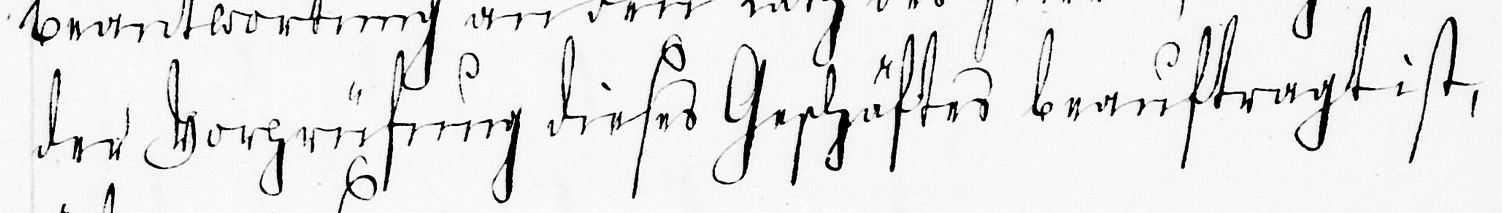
der Vorprüfung dieses Geschäftes beauftragt ist,
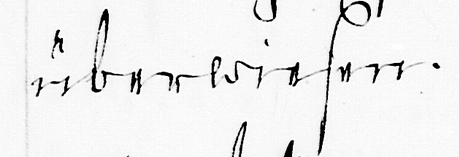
überwiesen.
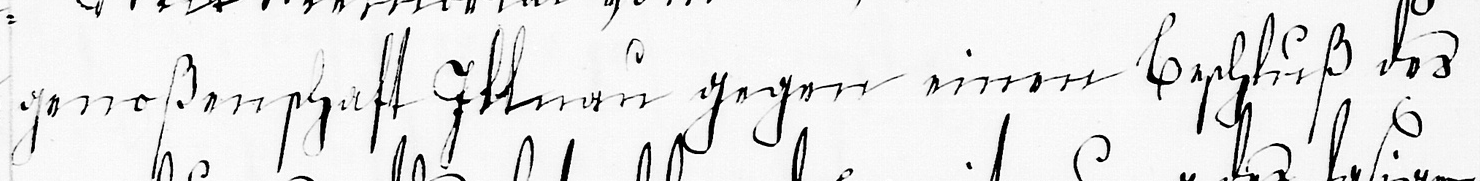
genoßenschaft Illnau gegen einen Beschluß des
